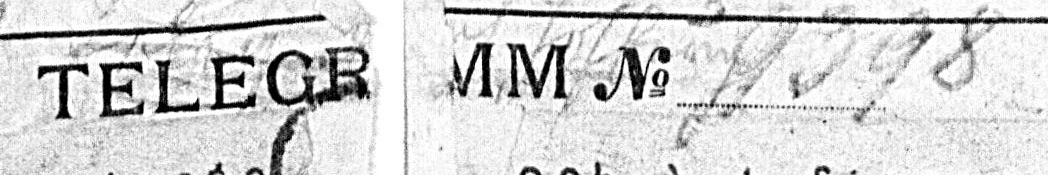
TELEGRxxMM N° 9398
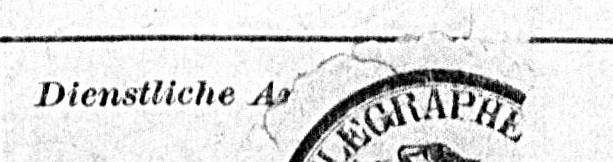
Dienstliche Axx
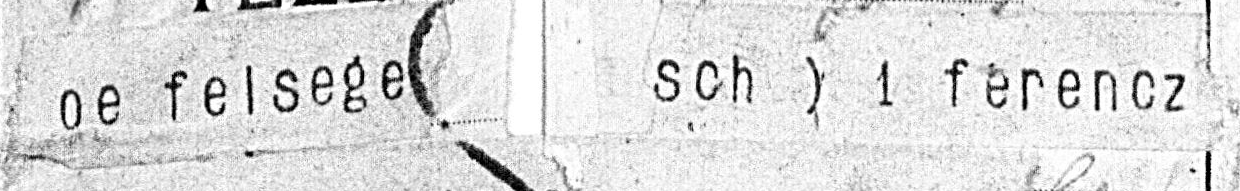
oe felsege xx sch) 1 ferencz
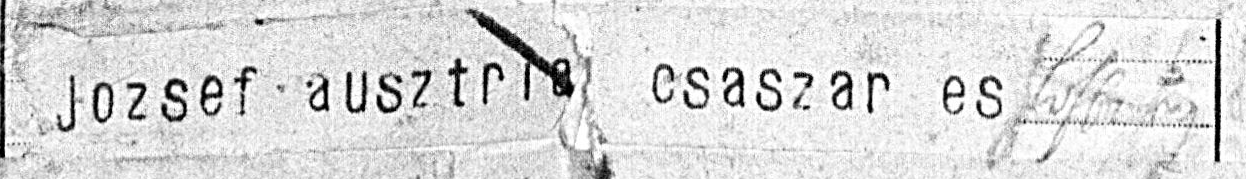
Jozsef austrxx csaszar es xx
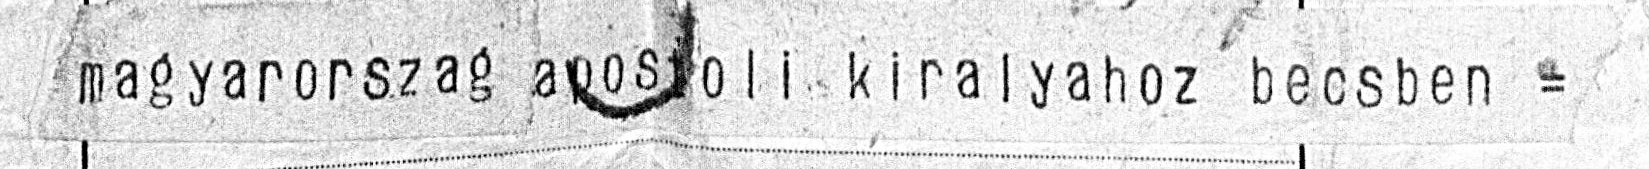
magyarorszag apostoli kiralyahoz becsben =
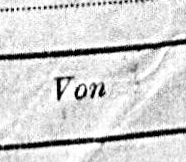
Von
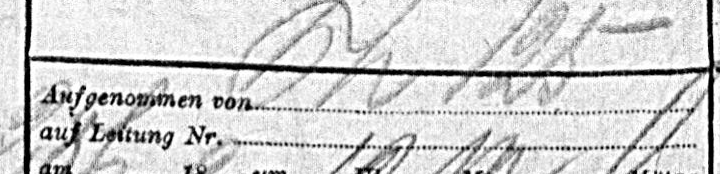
Aufgenommen von ...
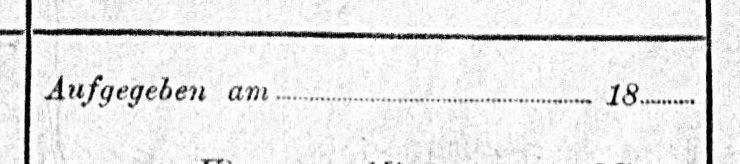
Aufgegeben am ... 18 ...
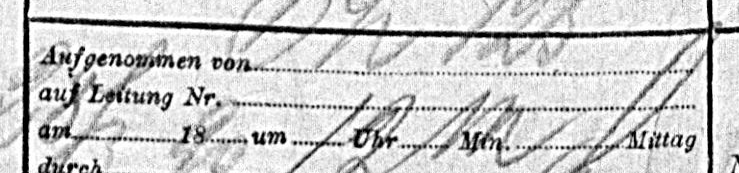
auf Leitung Nr. ...
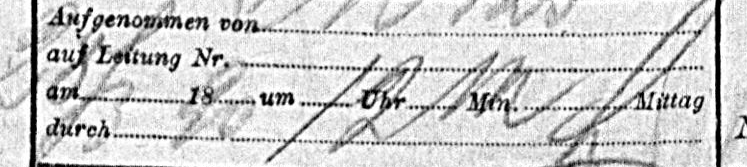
am ... 18... um... Uhr ... Min. ... Mittag
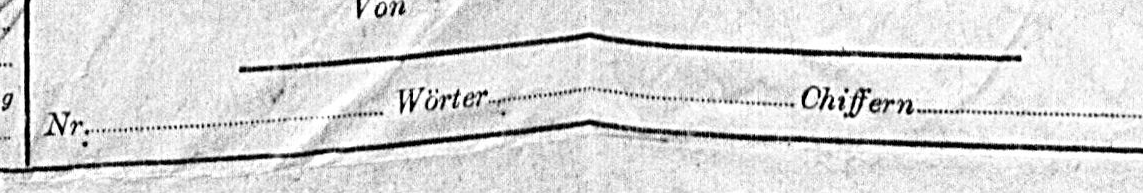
Nr. ... Wörter ... Chiffern ...
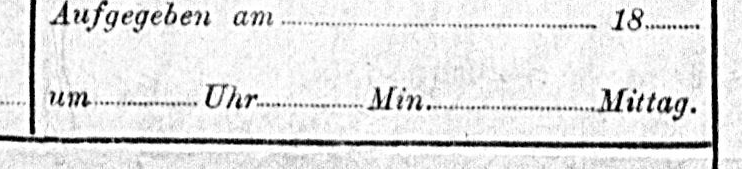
um ... Uhr ... Min. ... Mittag.
